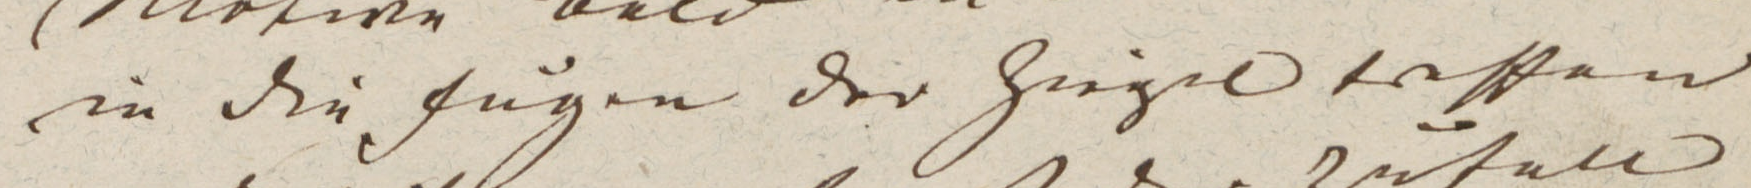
in die Fugen der Ziegel treffen
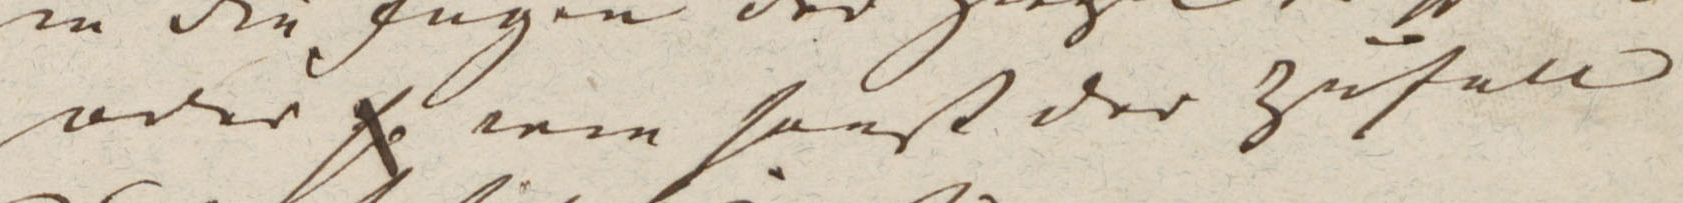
oder so wie sonst der Zufall
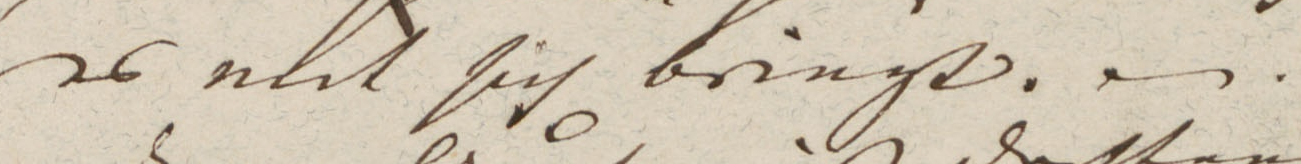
es mit sich bringt. – .
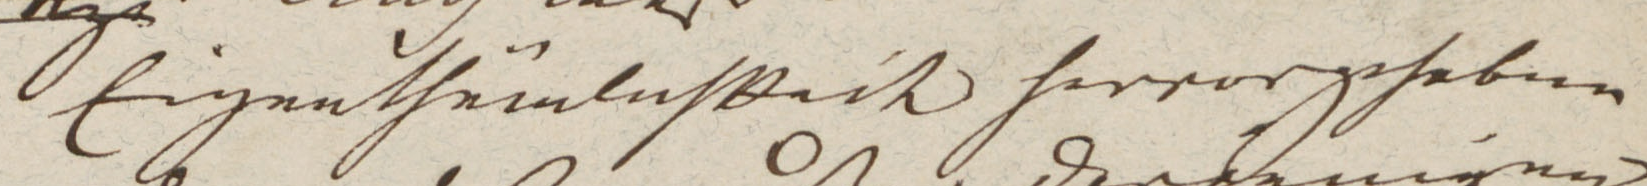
Eigenthümlichkeit hervorgehoben
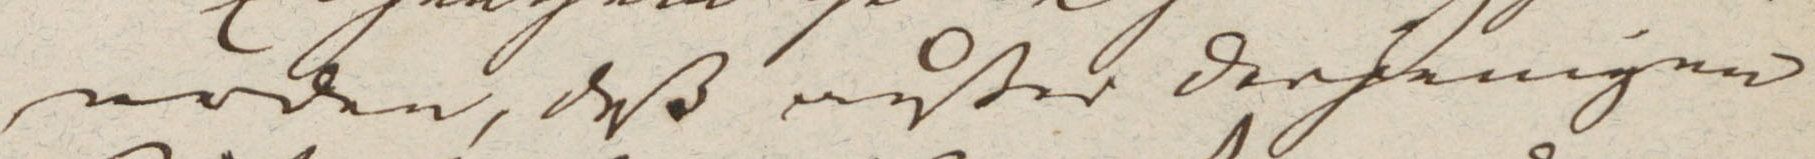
werden, dass ausser derjenigen
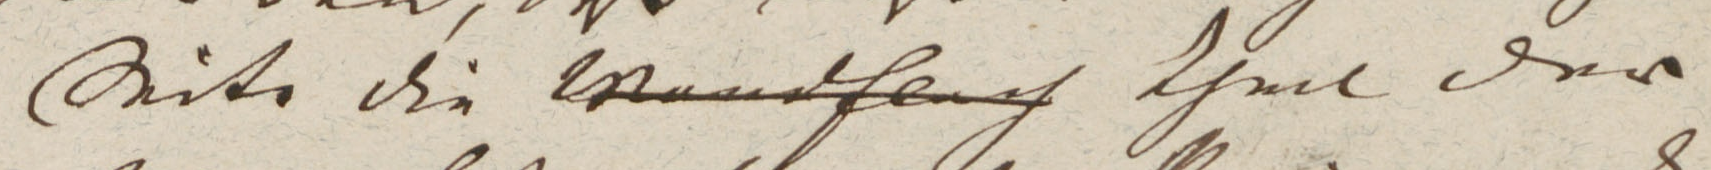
Seite die Wandflach Theil der
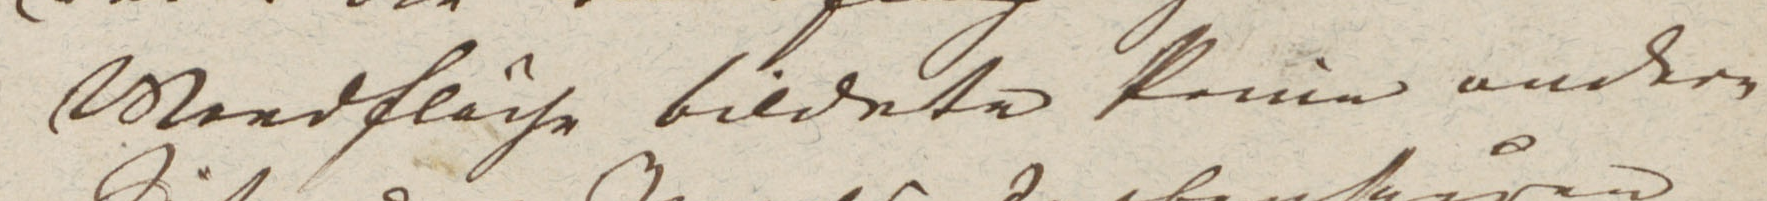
Wandfläche bildete keine andere
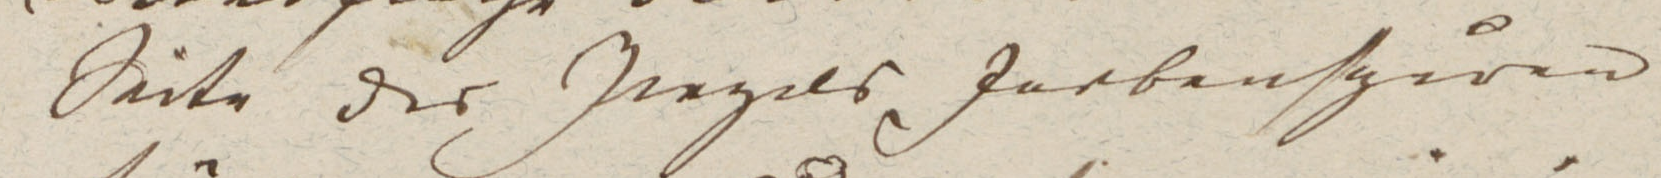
Seite des Ziegels Farbenspuren
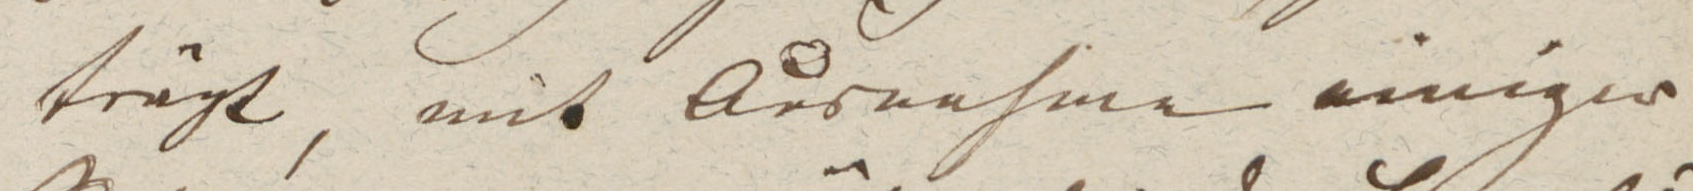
trägt, mit Ausnahme einiger
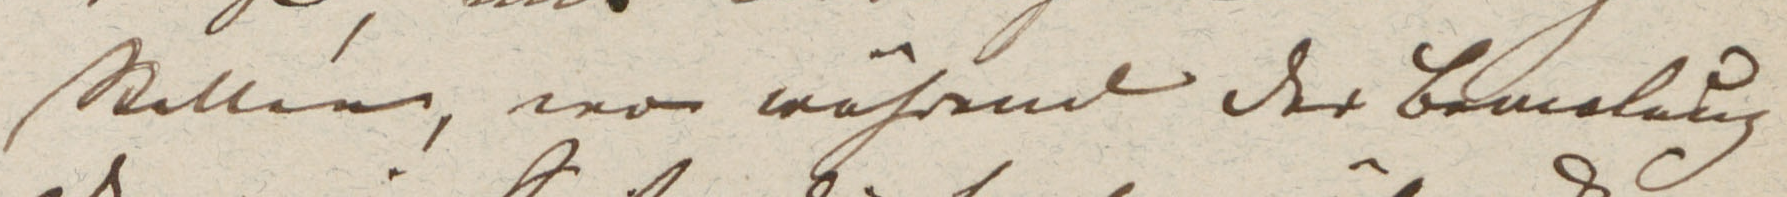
Stellen, wo während der Bemalung
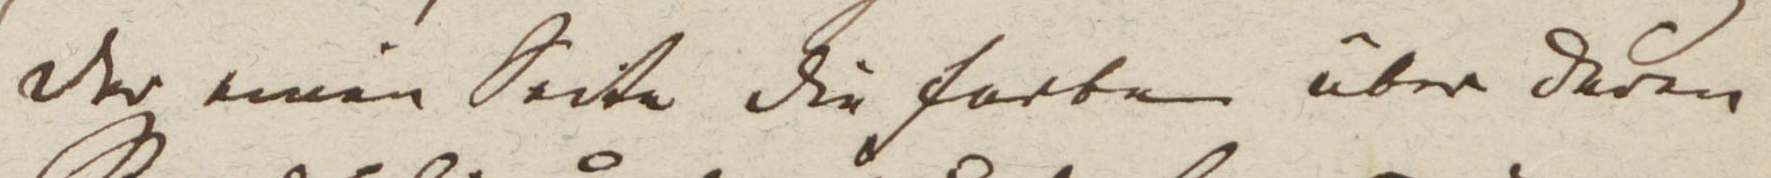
der einen Seite die Farbe über deren
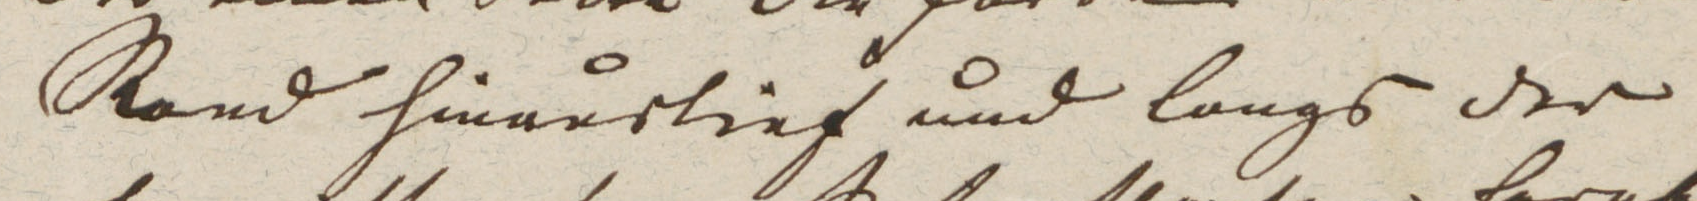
Rand hinauslief und langs der
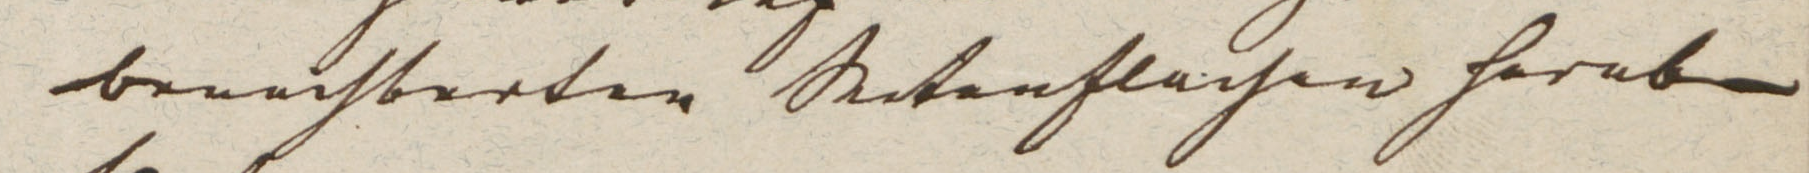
benachbarten Seitenflächen herab-
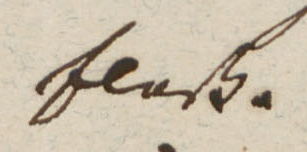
floss.
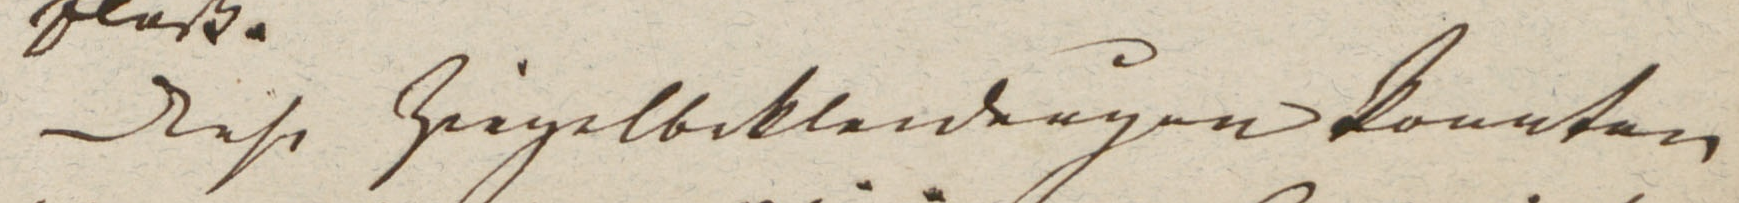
Diese Ziegelbekleidungen konnten
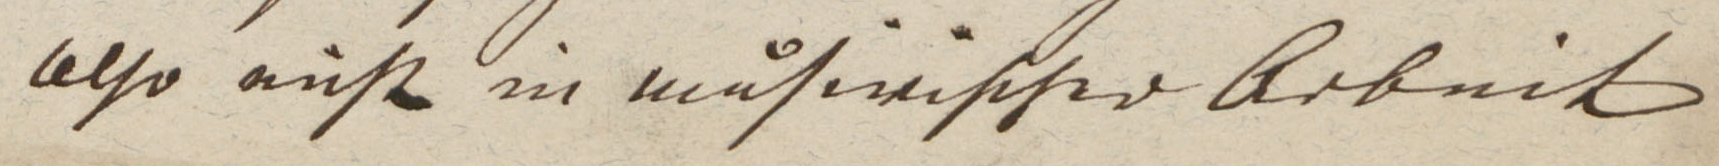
also nicht in musivischer Arbeit
